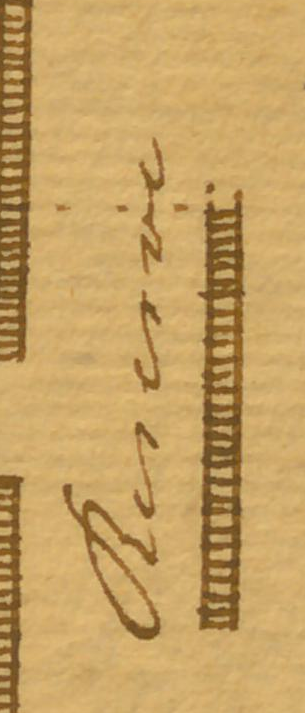Reserve
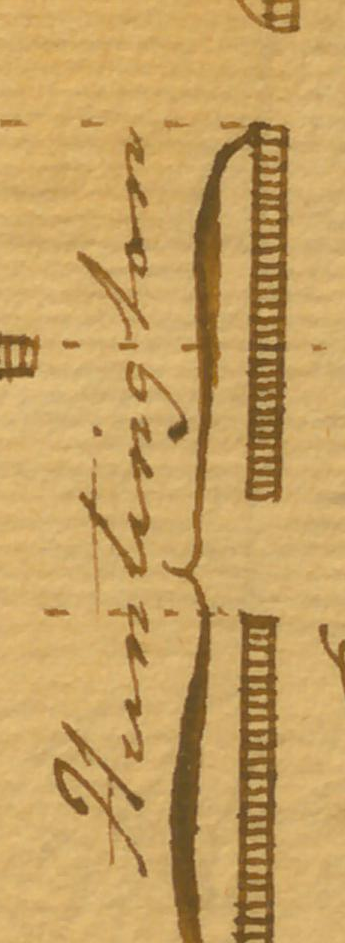Huntington
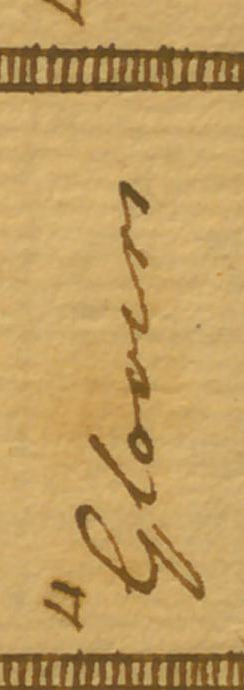Glovers
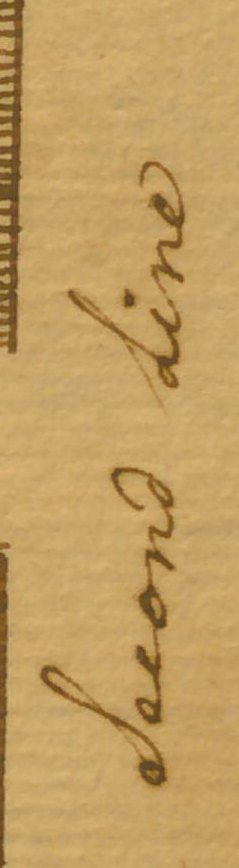Second Line
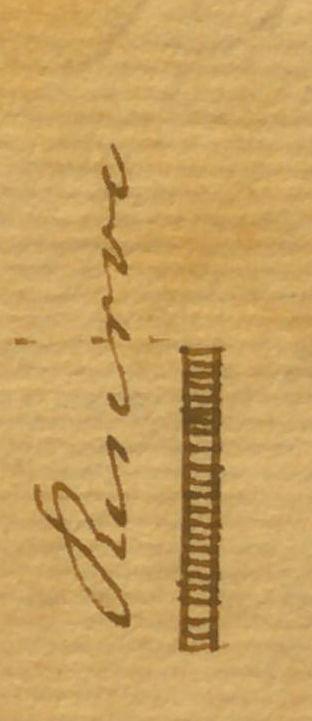Reserve
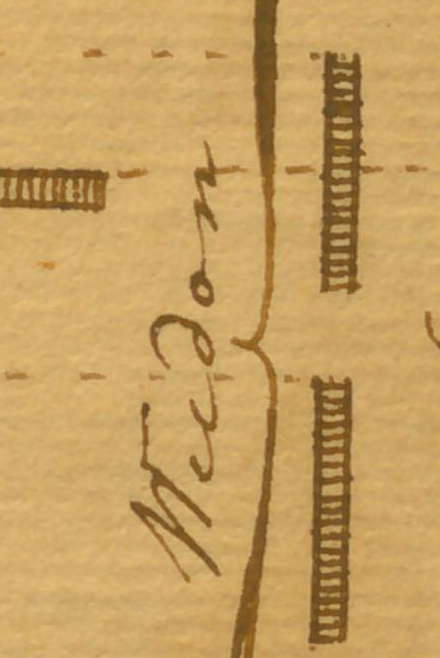Weedon
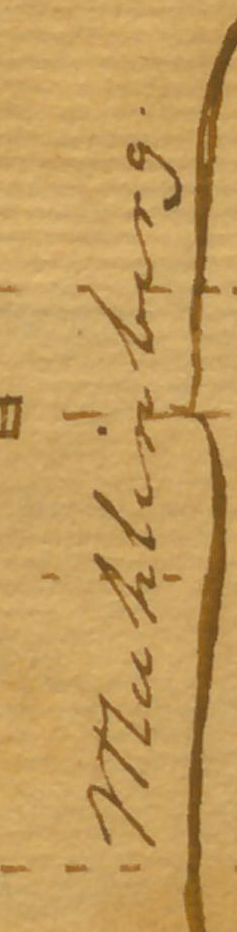Muhlinberg
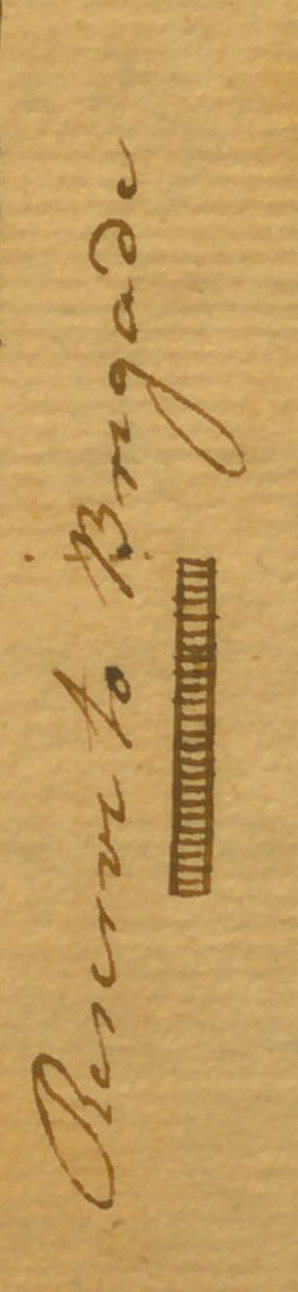Reserve to Brigade
